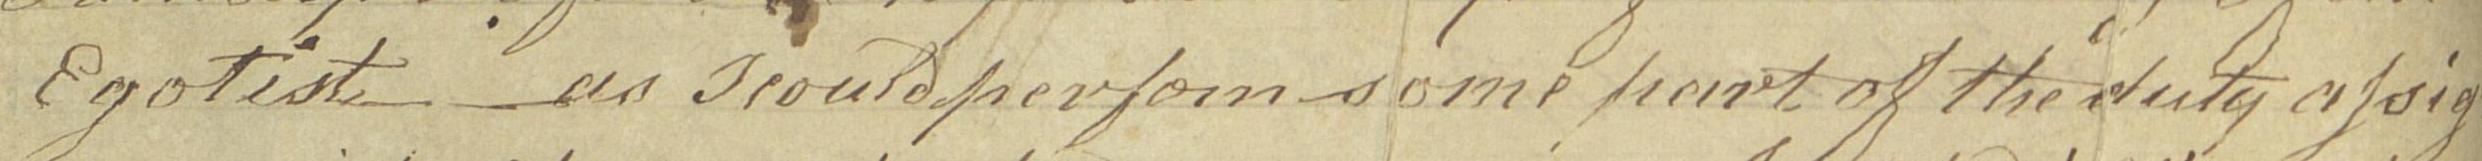Egotist. as I could perfom some part of the duty assign
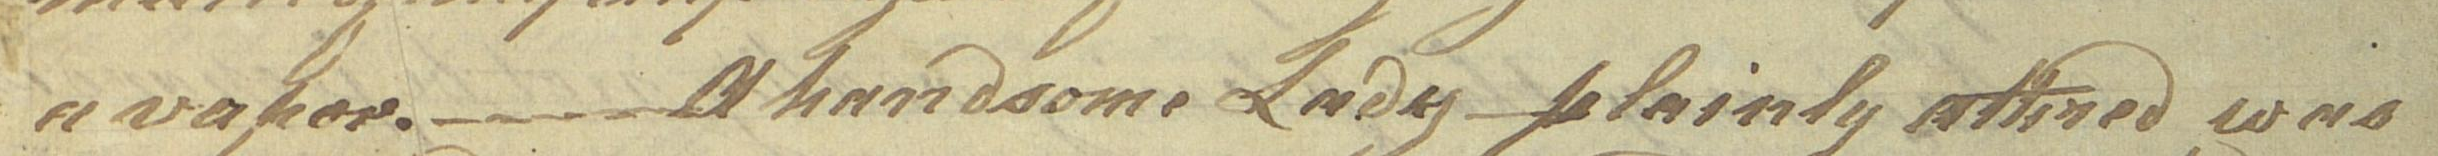a vapor. A handsome Lady- plainly attired was
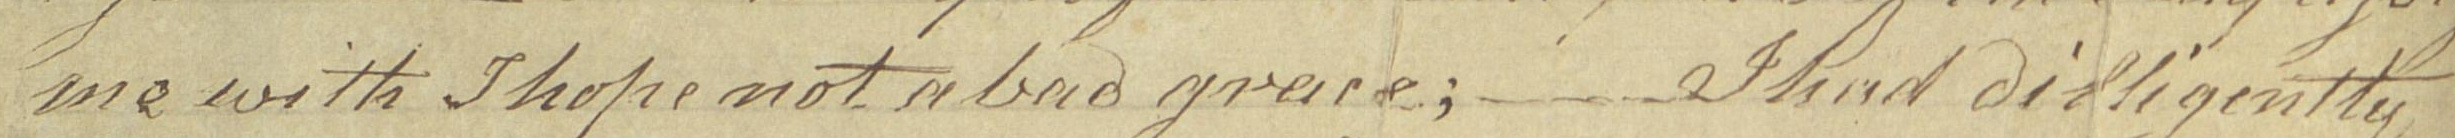me with I hope not a bad grace; I had dilligently
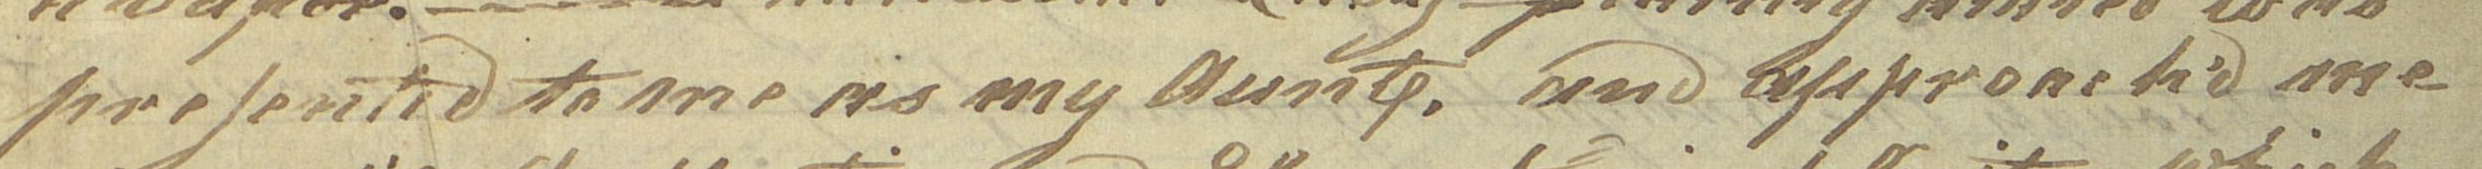presented to me as my Aunt, and approachd me
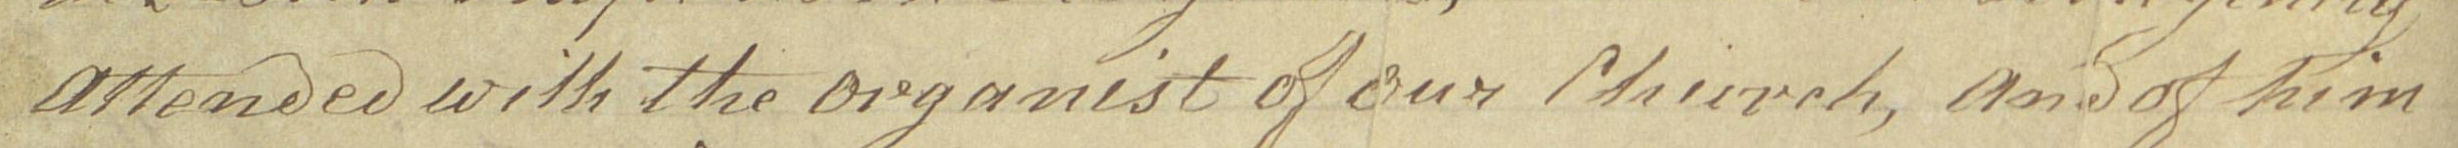attended with the organist of our Church and of him
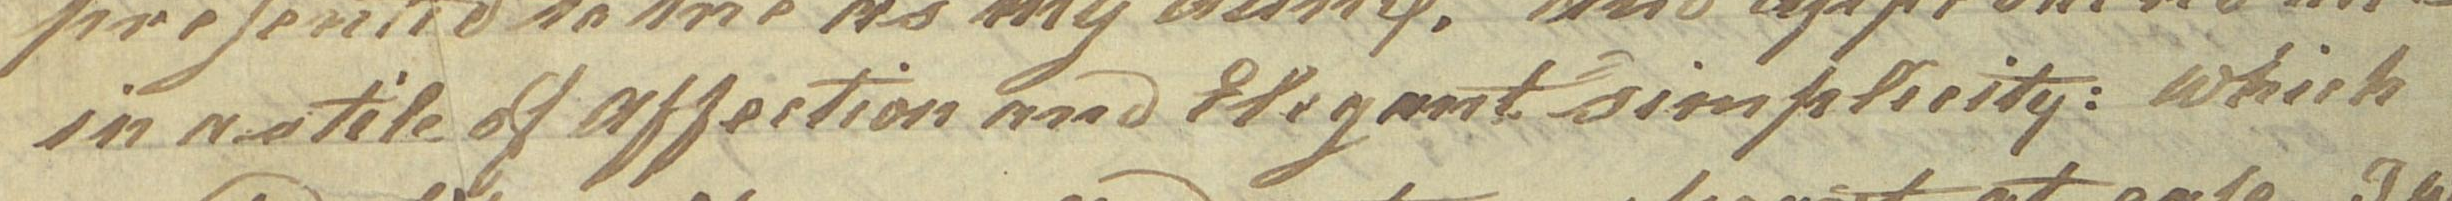in a stile of Affection and Elegant simplicity: which
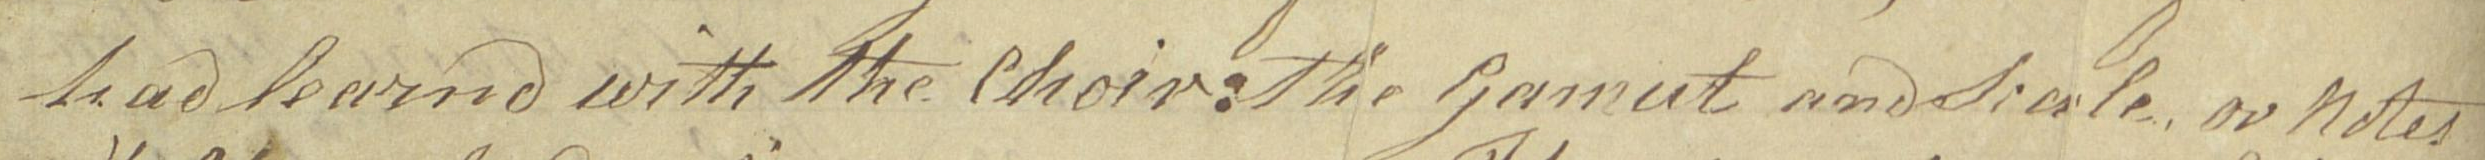had learnd with the Choir: the Gamut and Scale, or Notes
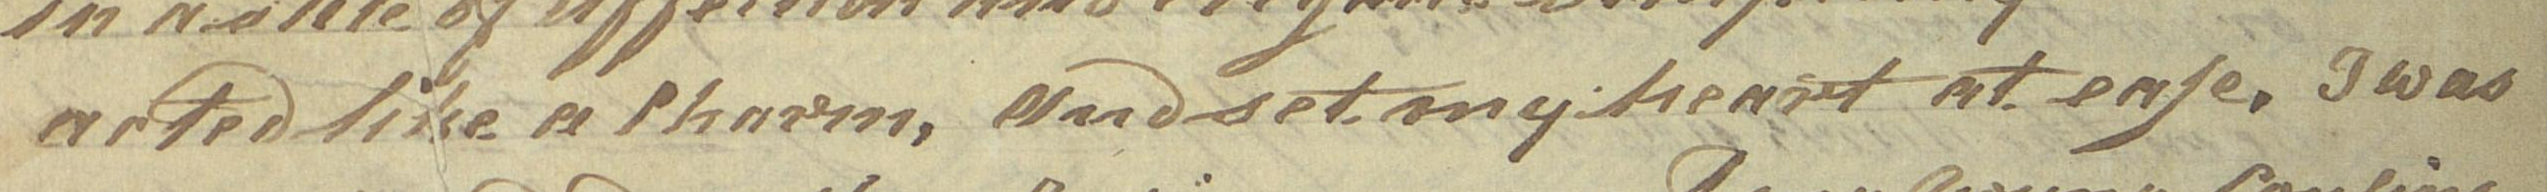acted like a Charm, And set my heart at ease, I was
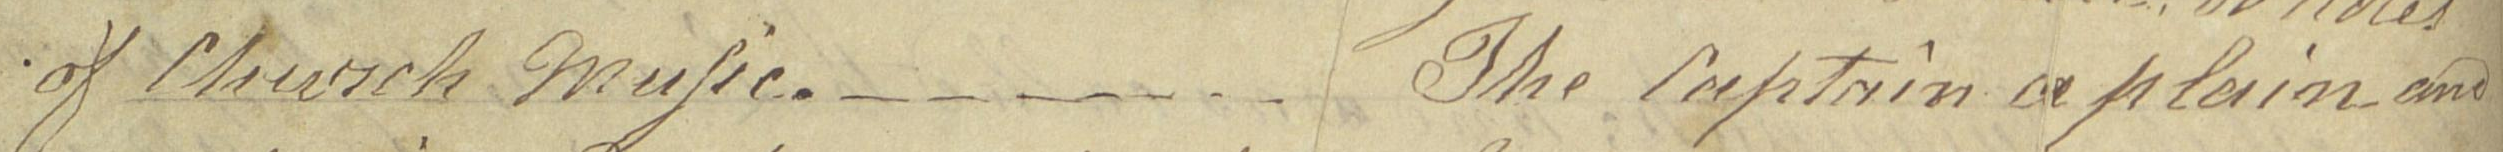of Church Music The Captain a plain and
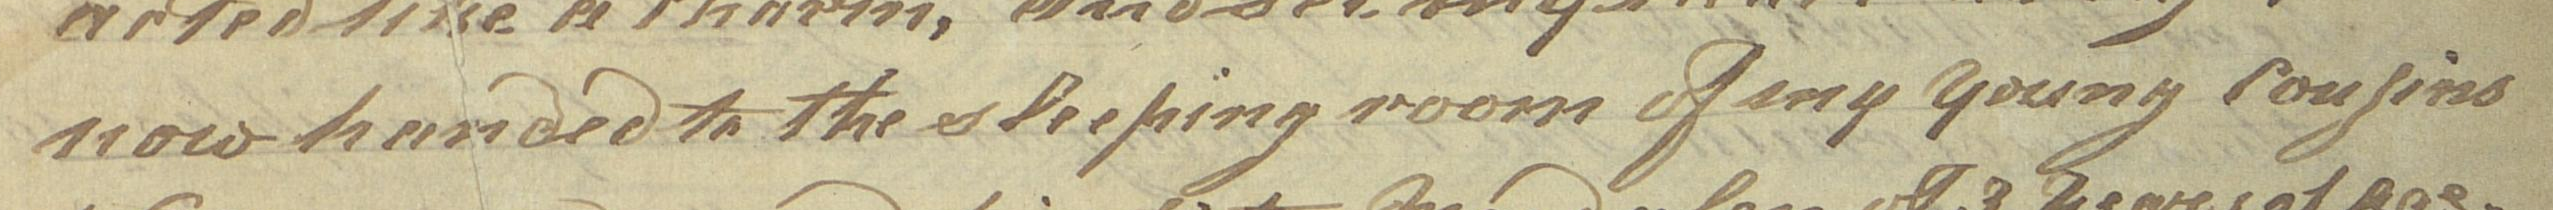now handed to the sleeping room of my young Cousins
